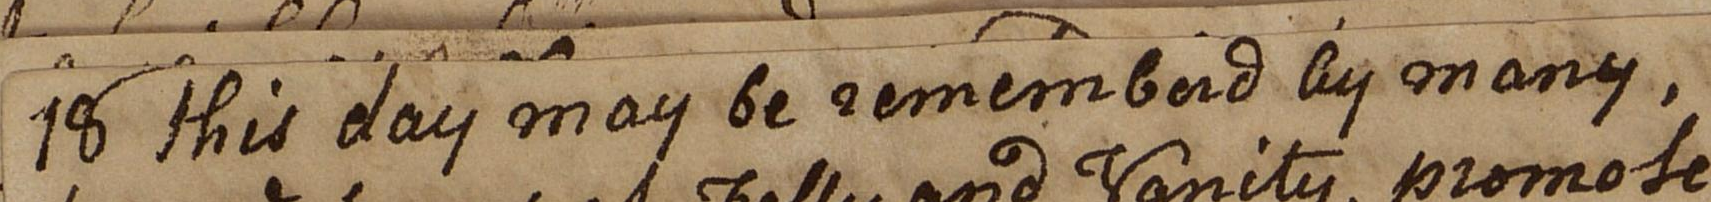18 this day may be rememberd by many,
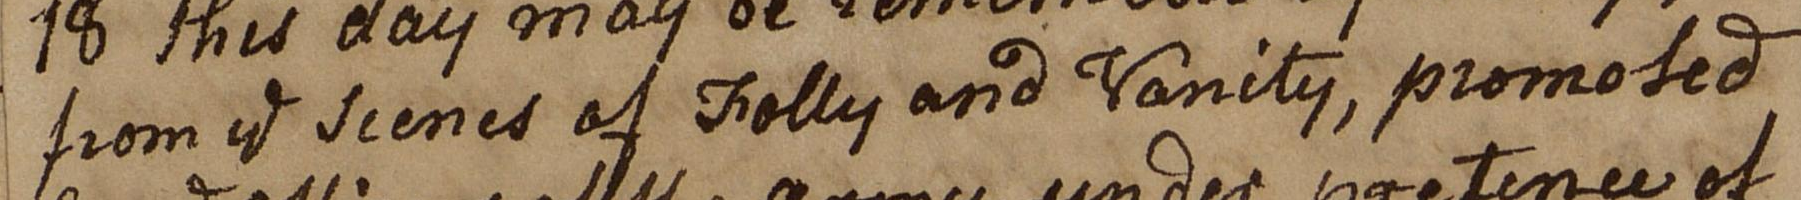from y^e scenes of Folly and Vanity, promoted
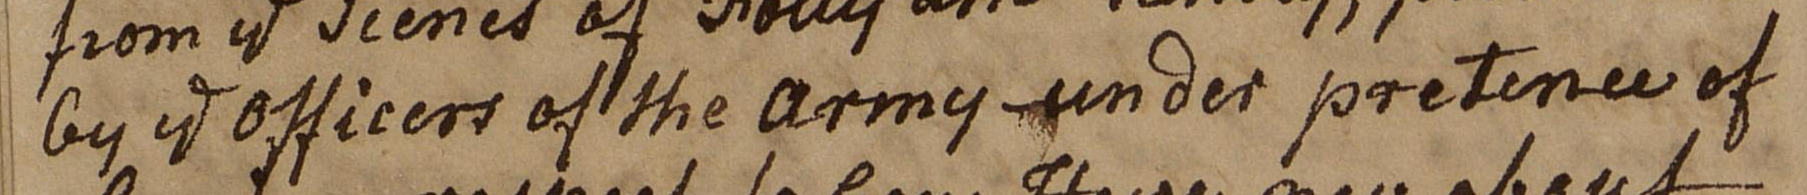by y^e officers of the army under pretence of
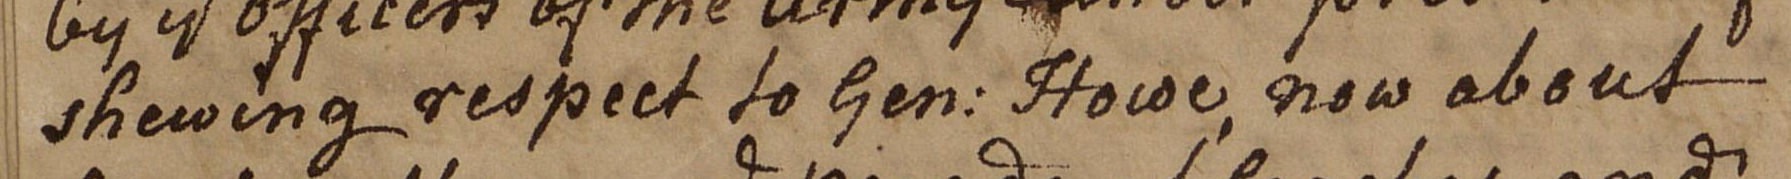shewing respect to Gen: Howe, now about
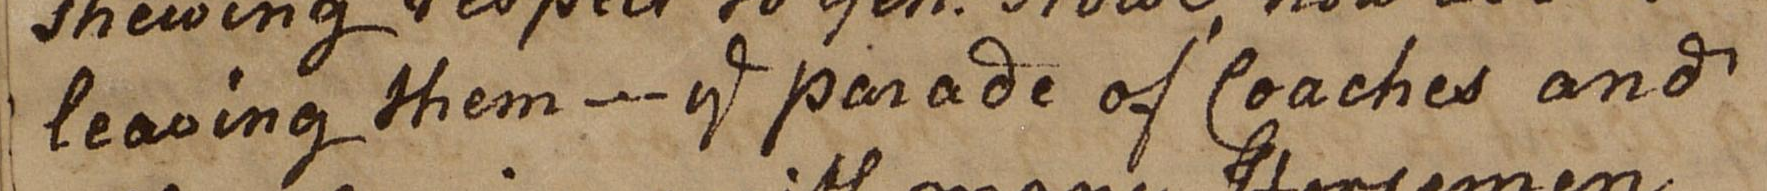leaving them- y^e parade of Coaches and
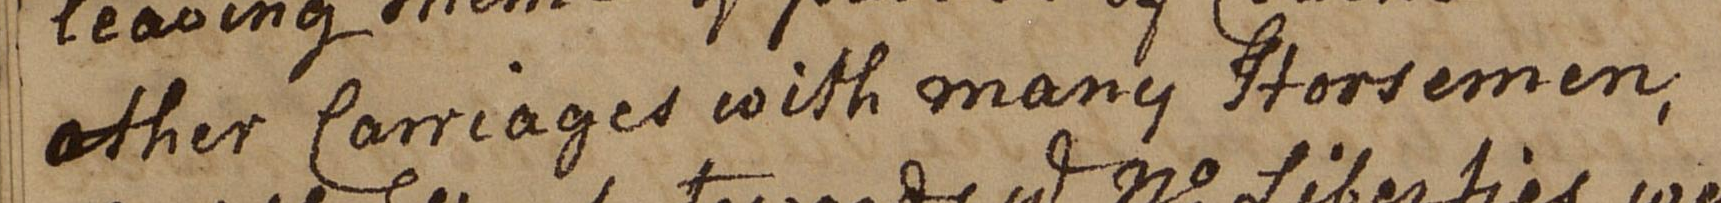other Carriages with many Horsemen,
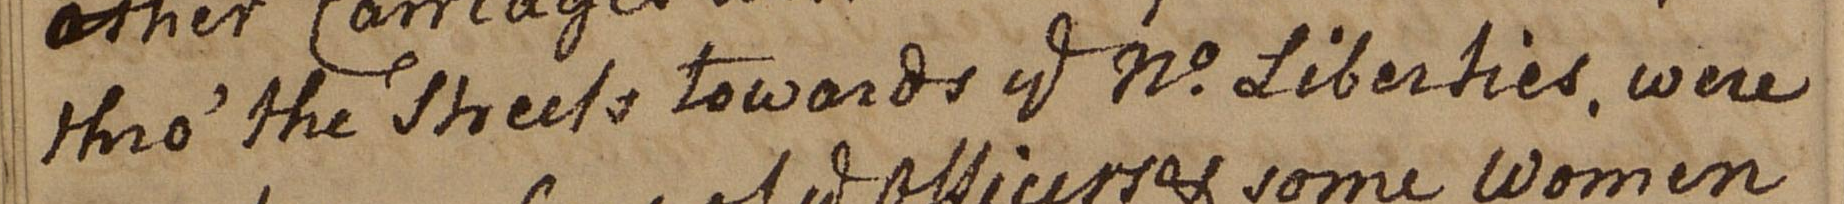thro' the streets towards y^e N^o. Liberties, were
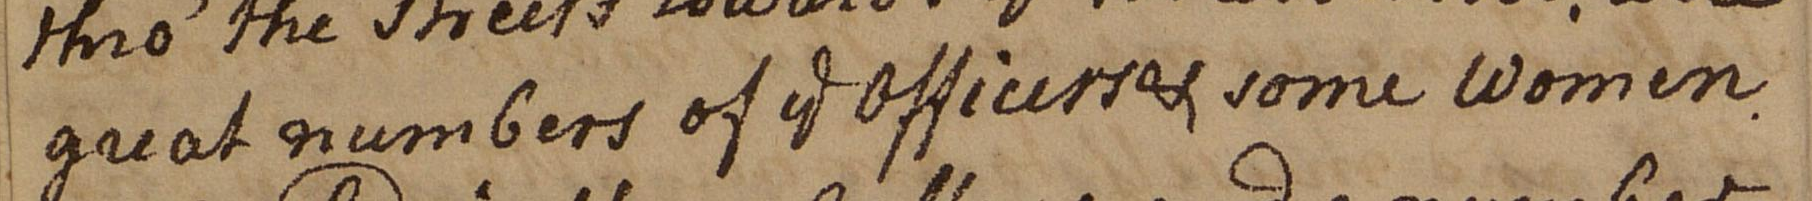great numbers of y^e Officers & some women
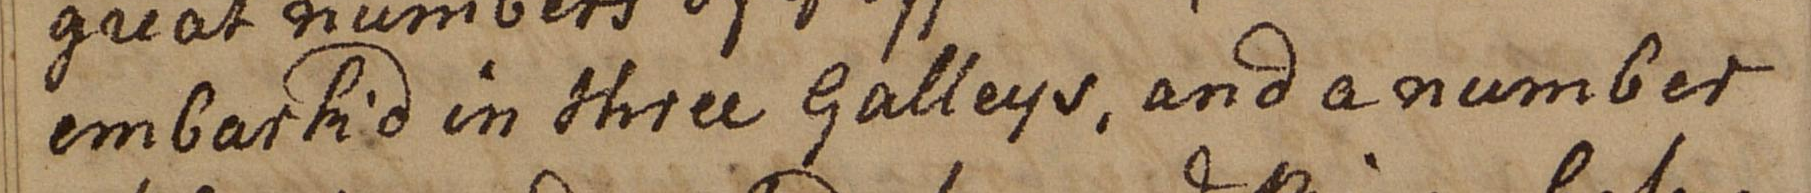embark'd in three Galleys, and a number
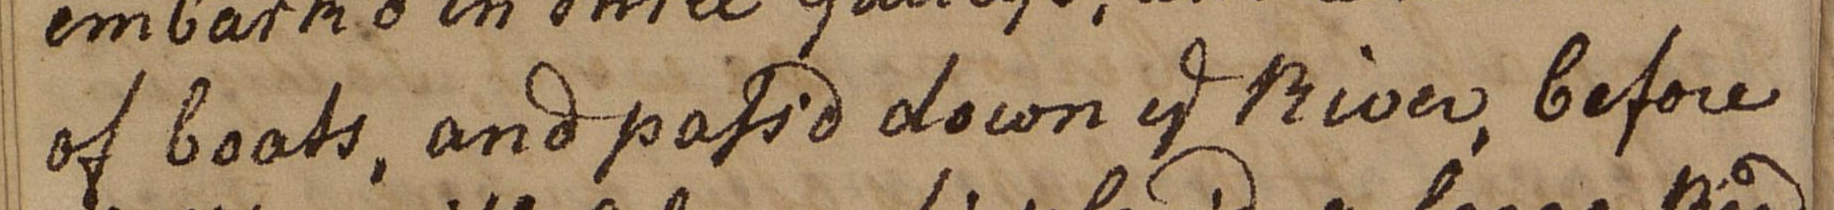of boats, and pass'd down y^e River, before
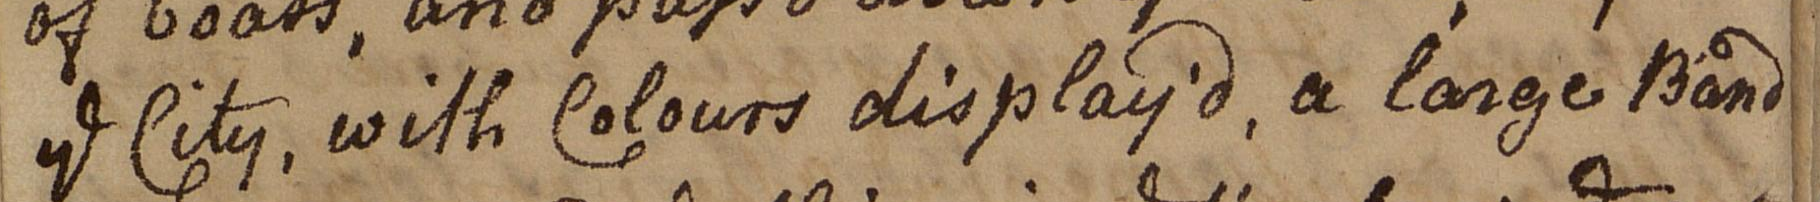y^e City, with Colours display'd, a large Band
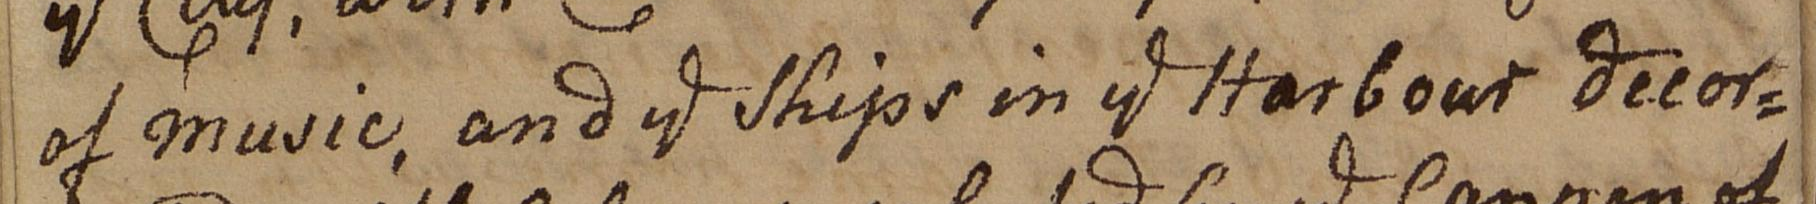of music and y^e Ships in y^e Harbour decor-
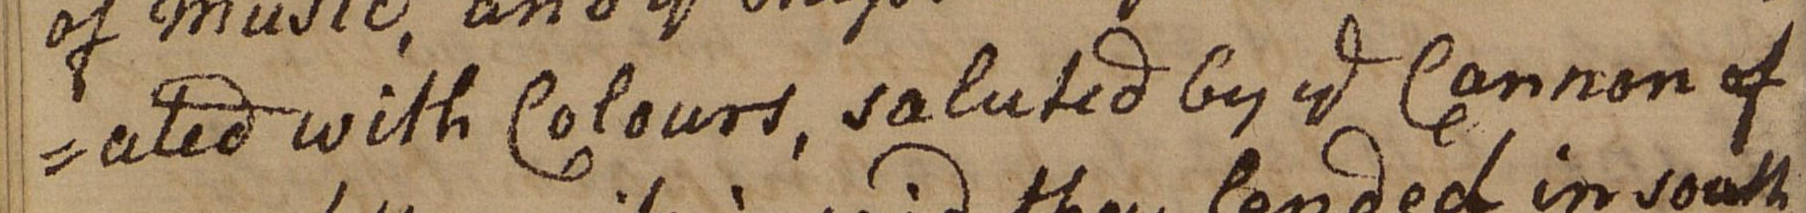-ated with Colours, saluted by y^e Cannon of
